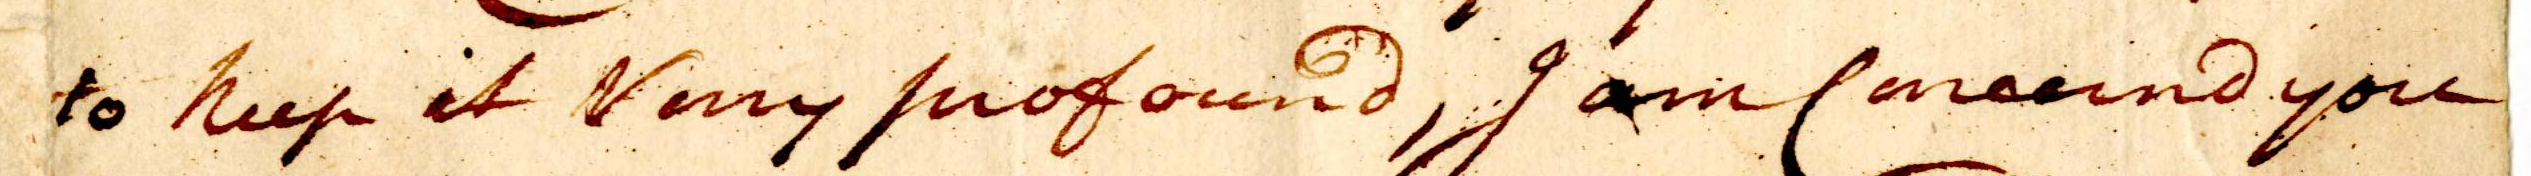to keep it very profound, I am Concernd you
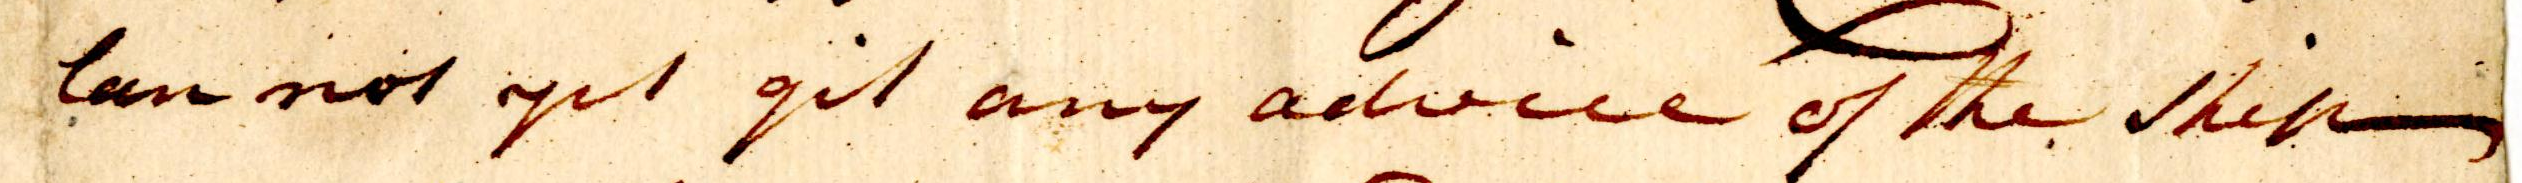can not yet git any advice of the ship-
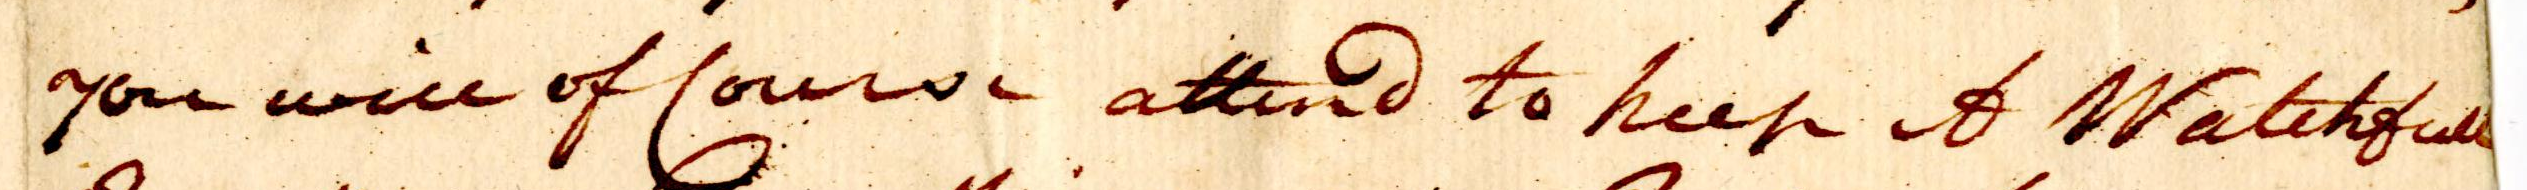you will of Course attend to keep A Watchfull
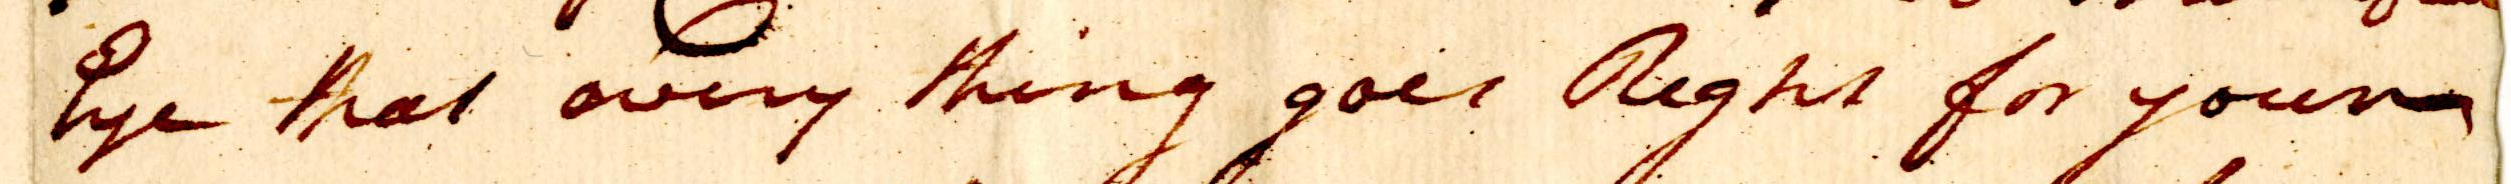Eye that every thing goes Right for your
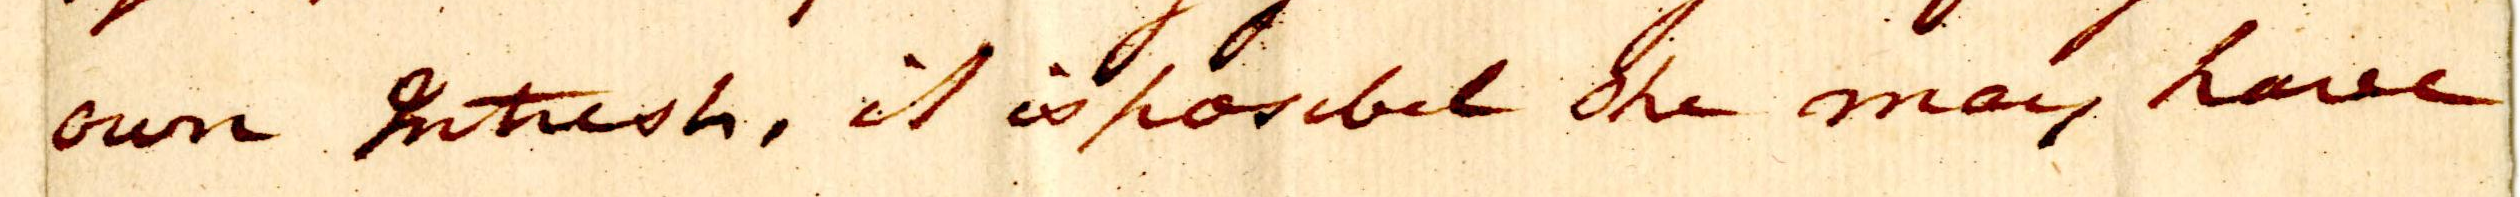own Intrest, it is possible she may have
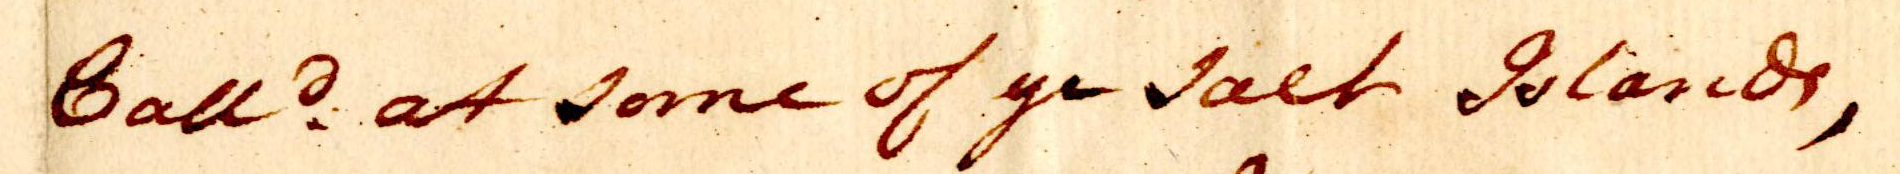Call^d. at some of ye Jaet Islands,
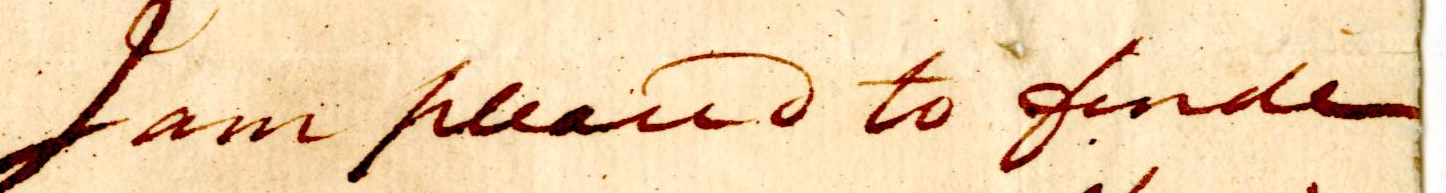I am pleased to finde
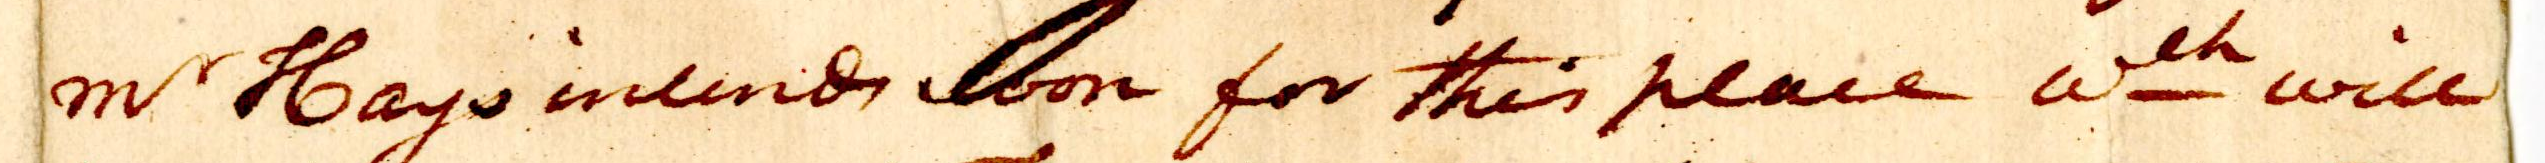M^r Hays intends soon for this peace w^ch will
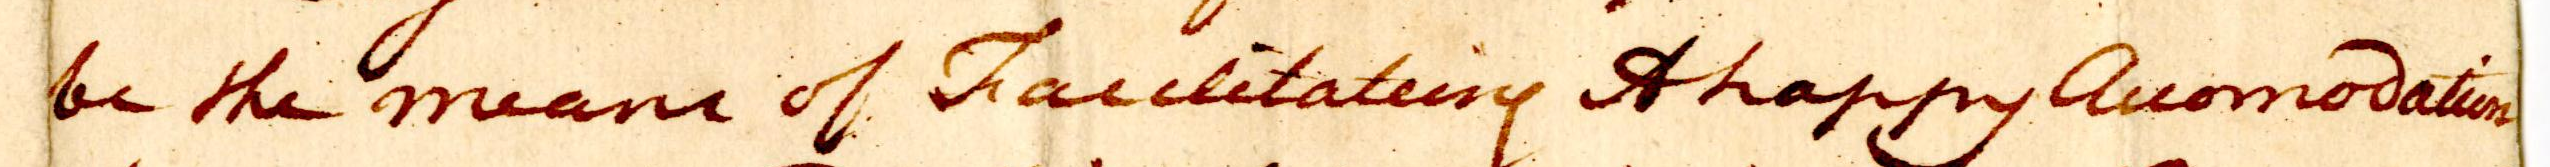be the means of Facilitating A happy Accommodation
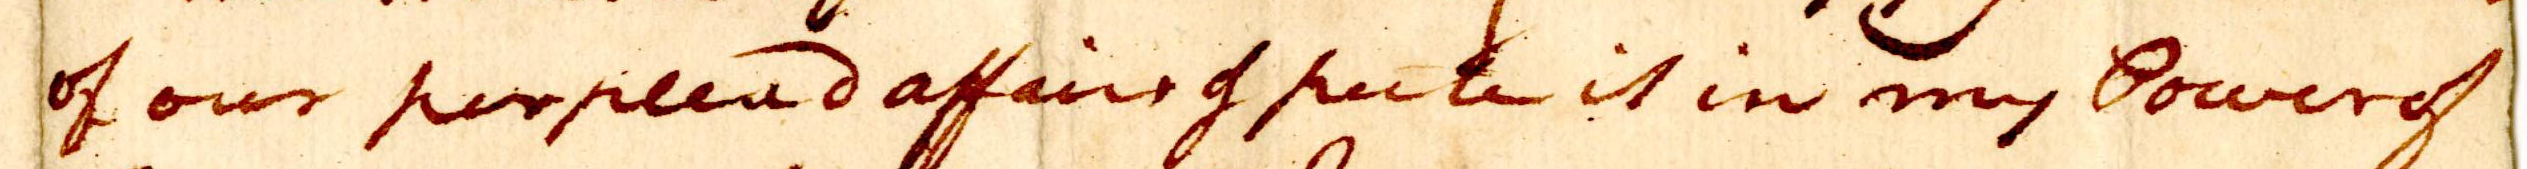of our perplesd affairs I pute it in my Power of
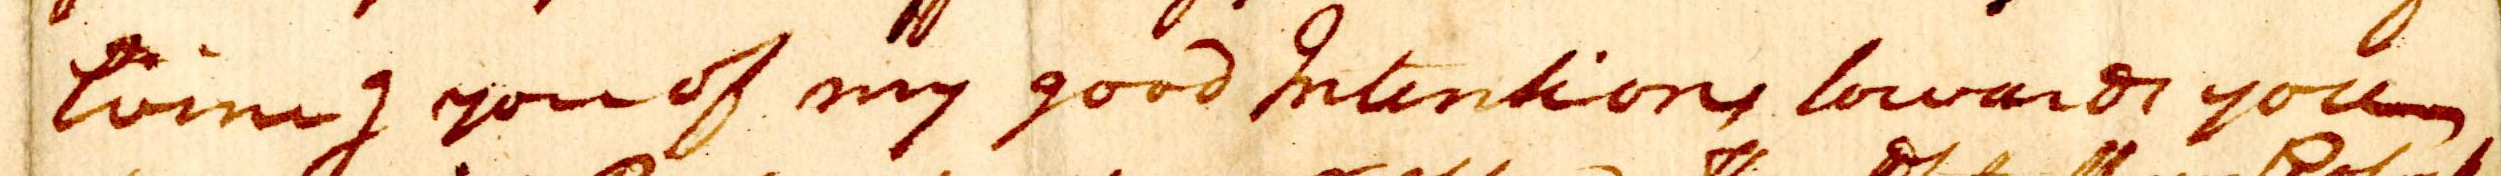giving you of my good Intentions towards you
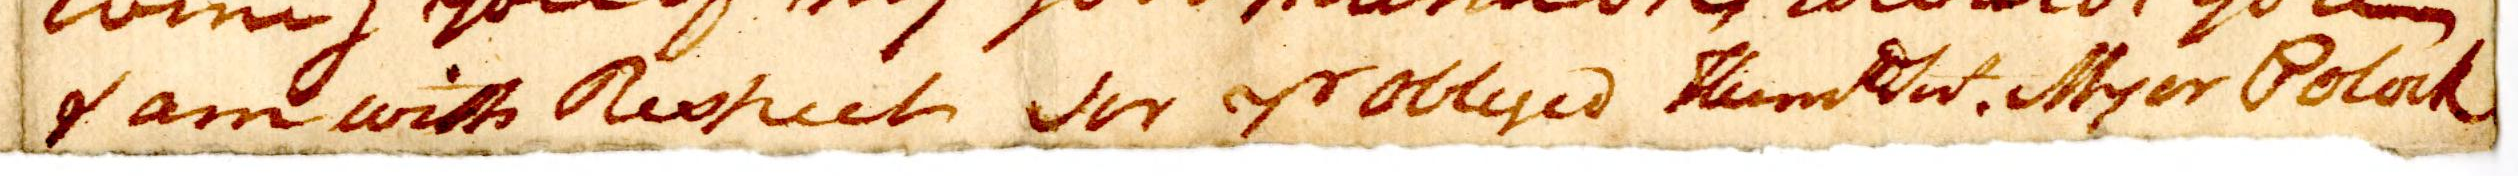& am with Respect Sir y^r. oblidged Hum^b Serv^t. Myer Polack
